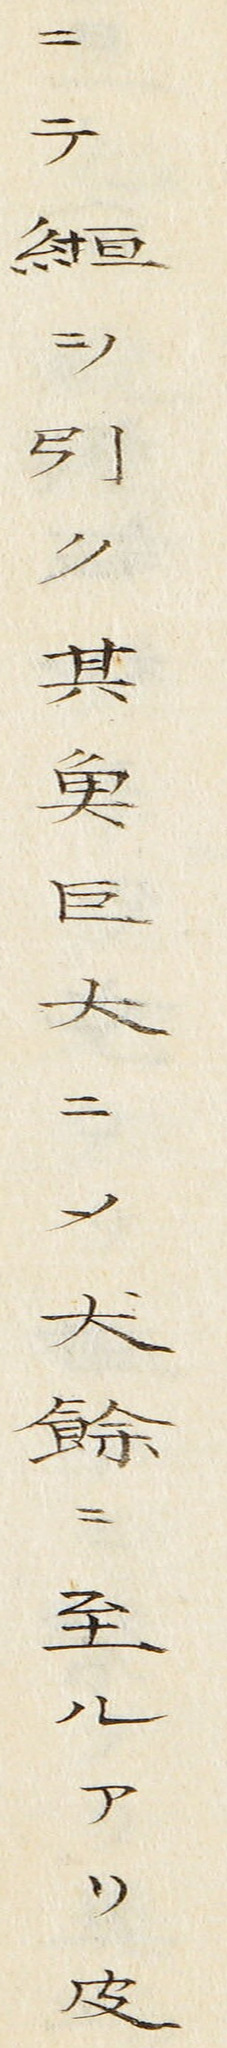ニテ絙？ヲ引ク其魚巨大ニシテ犬余ニ至ルアリ皮
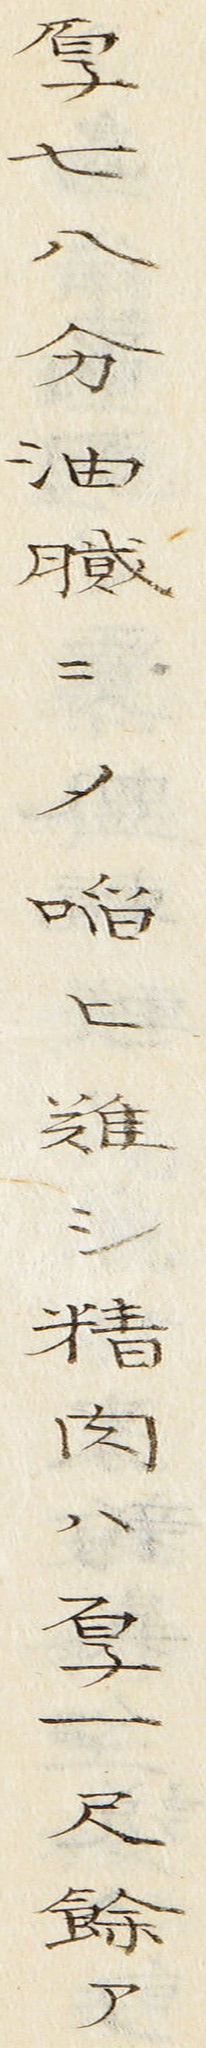厚七八分油膩ニシテ啗ヒ難シ精肉ハ厚一尺余ア
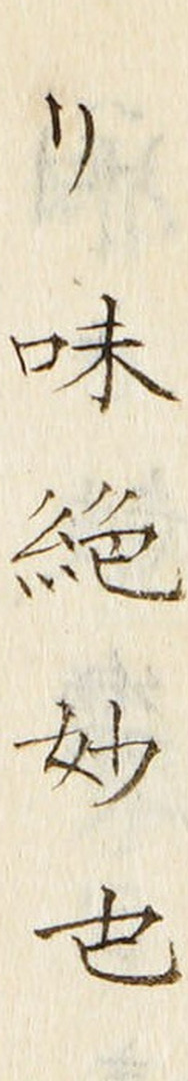リ味絶妙也
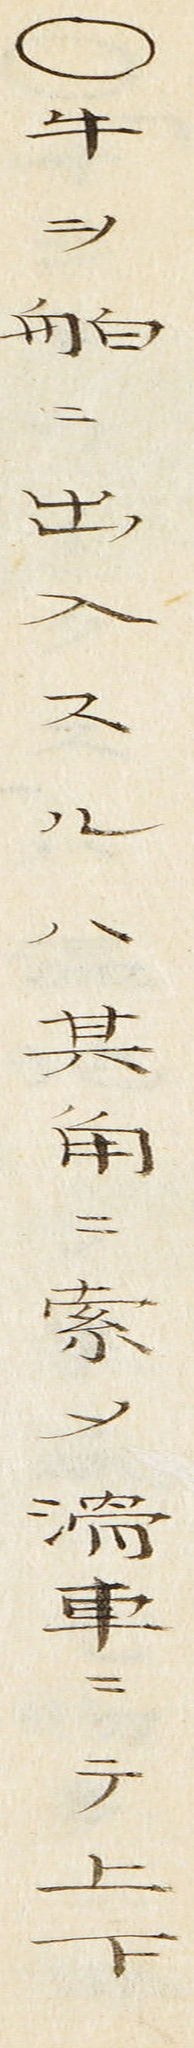〇牛ヲ舶ニ出入スルハ其角ニ索シテ滑車ニテ上下

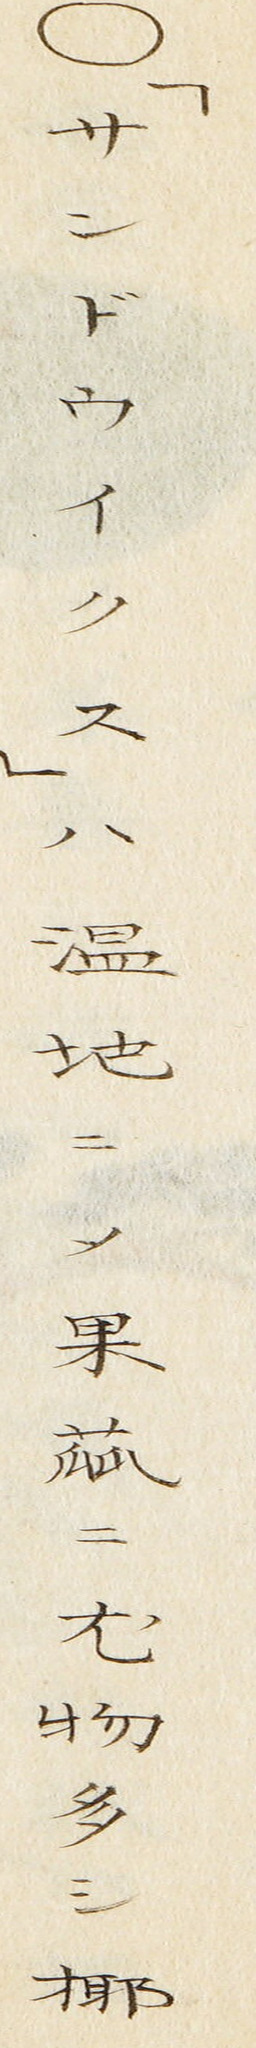〇「サンドウイスク」ハ温地ニシテ果蓏ニ尤物多シ椰
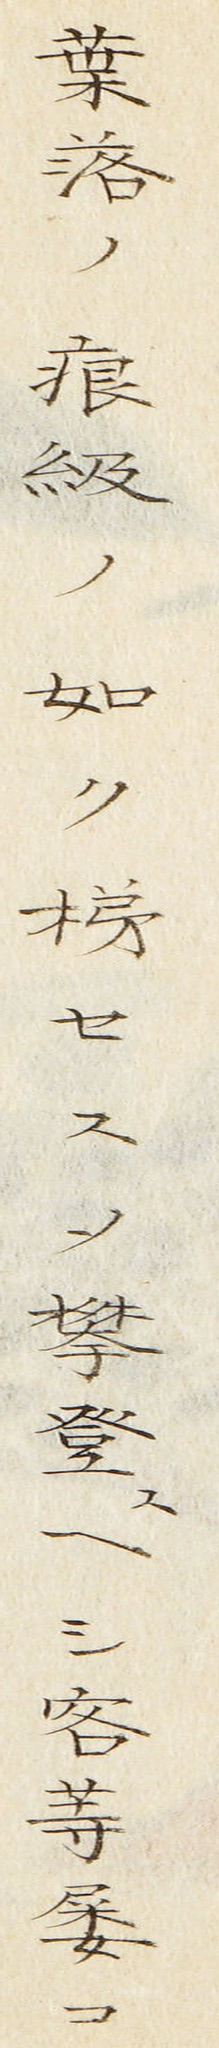葉落ノ痕級ノ如ク梯セスシテ攀登スヘシ客等屡コ
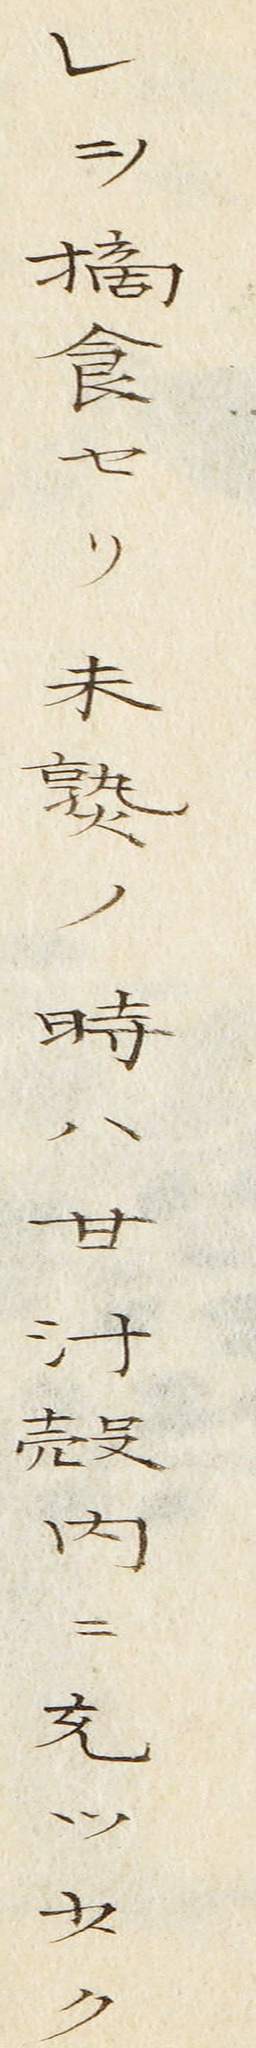レヲ摘食セリ未熟ノ時ハ甘汁殻内ニ充ツ少ク
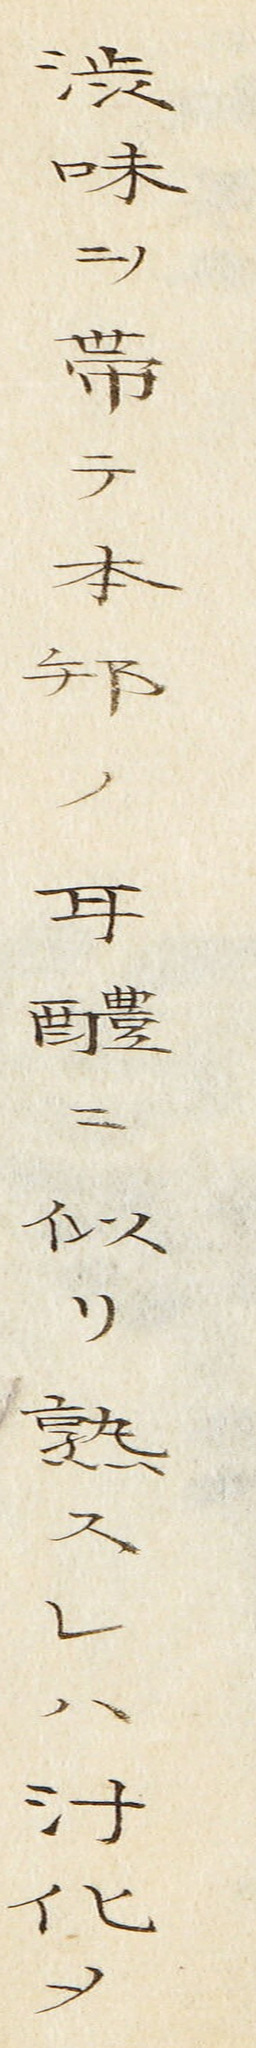渋味ヲ帯テ本邦ノ甘？醴ニ似リ熟スレハ汁化シテ
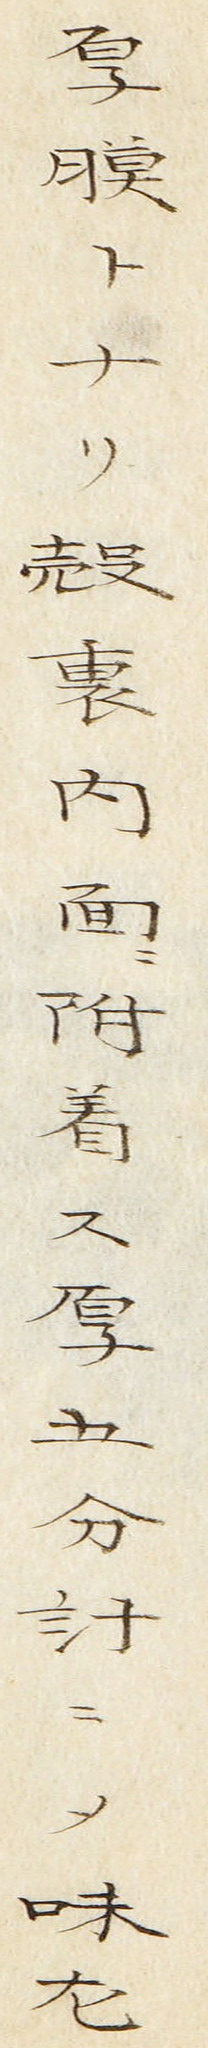厚膜トナリ殻裏内面ニ附着ス厚五分計ニシテ味尤
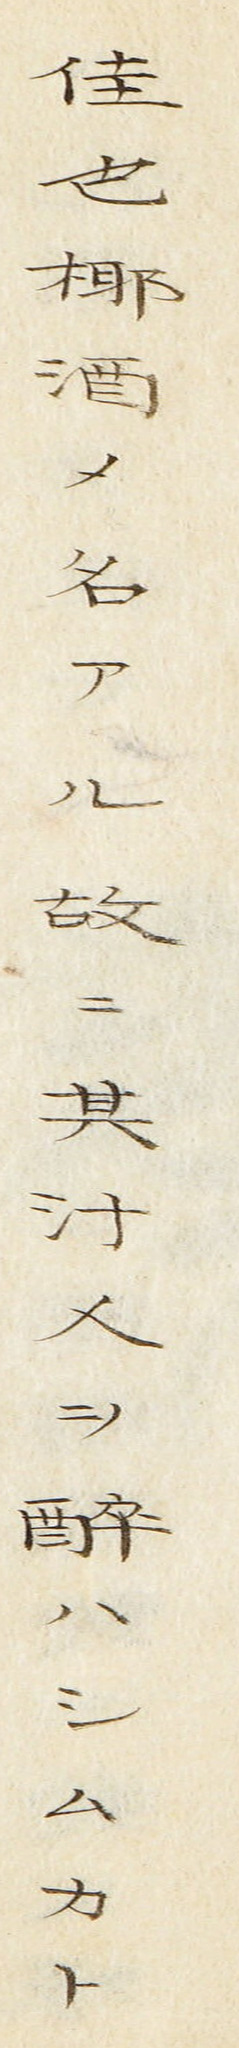佳也椰酒メ名アル故ニ其汁人ヲ醉ハシムカト

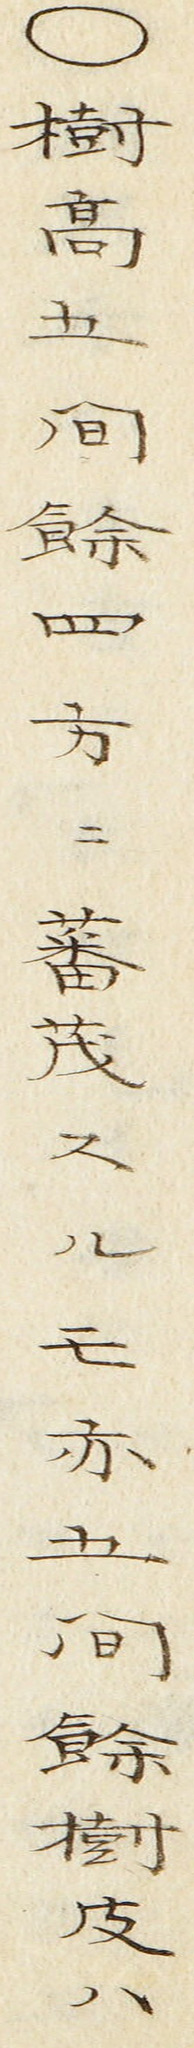〇樹高五間余四方ニ蕃喪スルモ亦五間余樹皮ハ
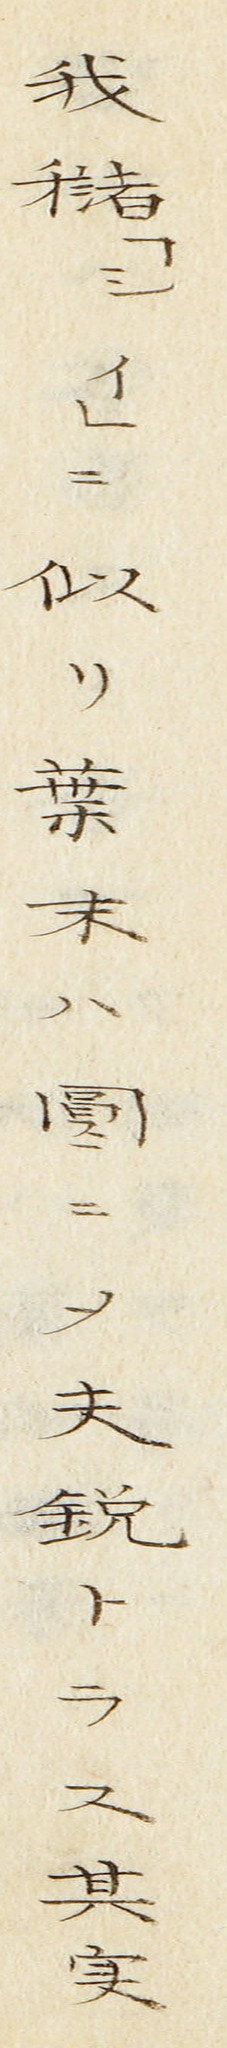我櫧？「シイ」ニ似リ葉末ハ円ニシテ夫鋭トラス其実
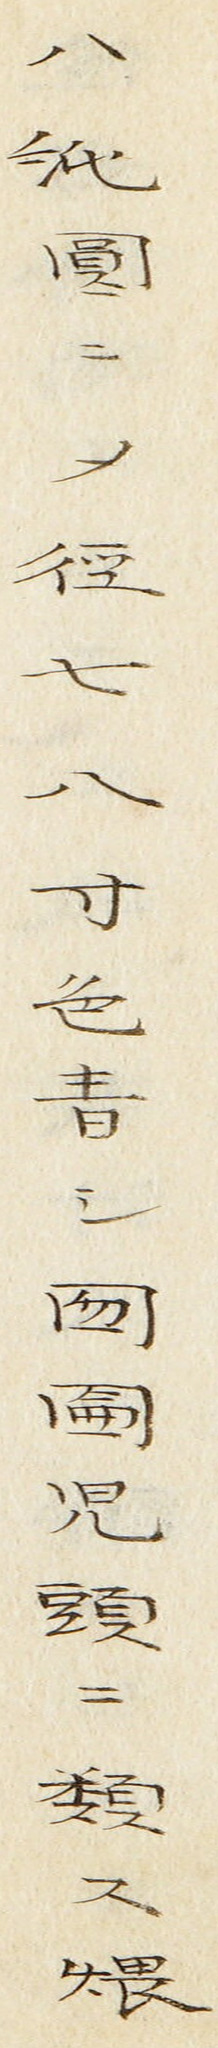ハ純円ニシテ径七八寸色青シ囫圇児頭ニ類ス煨
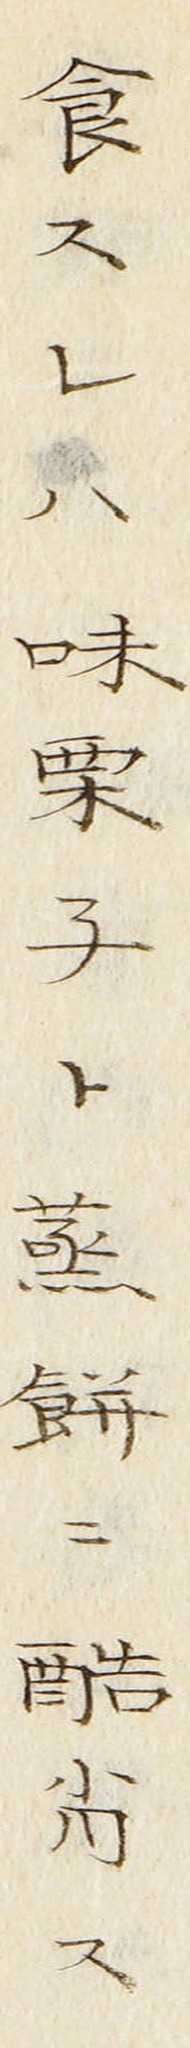食スレハ味栗子ト蒸餅ニ酷肖ス
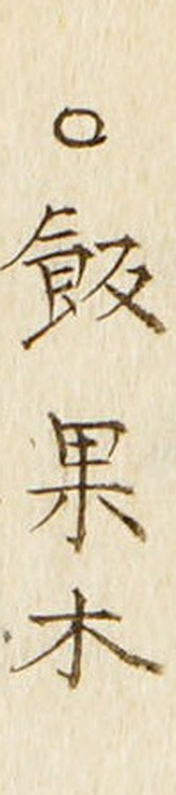〇飯果木
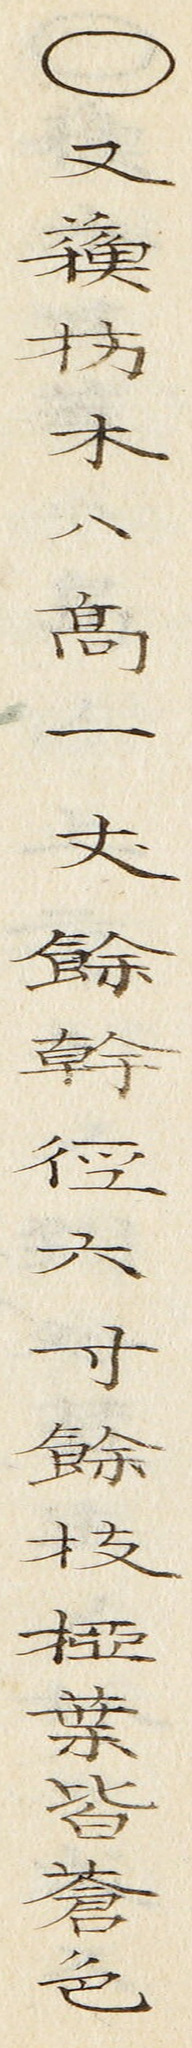〇又蘓枋木ハ高一丈余幹径六寸余枝椏葉皆蒼色
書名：蕃談
